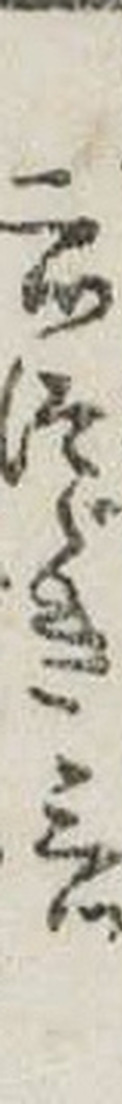二ツつゞき三ツ
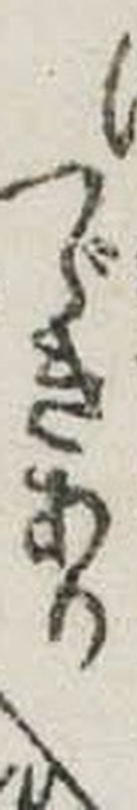つゞきあり
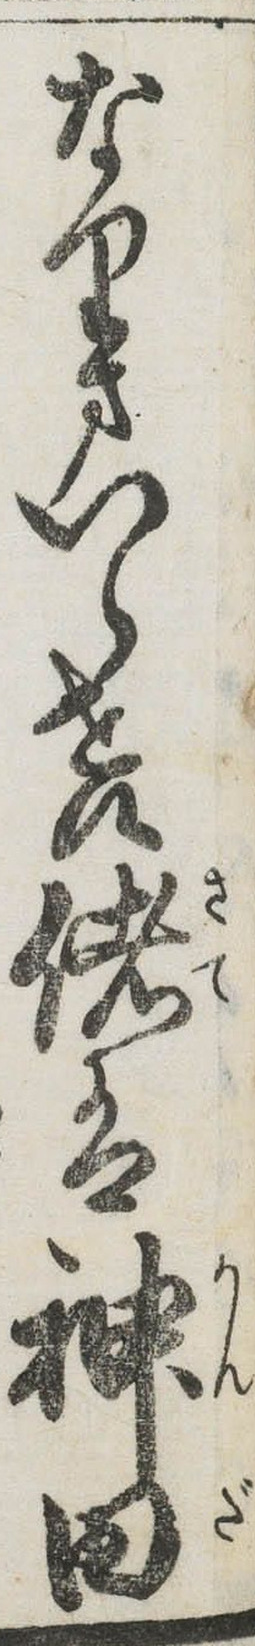なりまいらせ候偖は神田
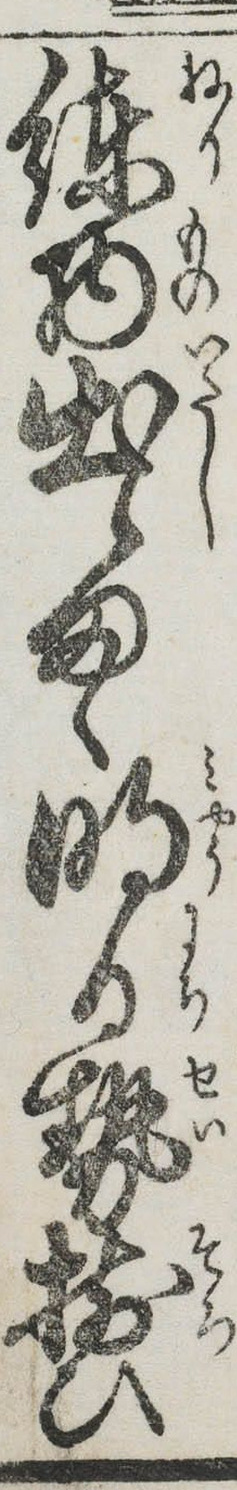練物出候まゝ明日勢揃ひ
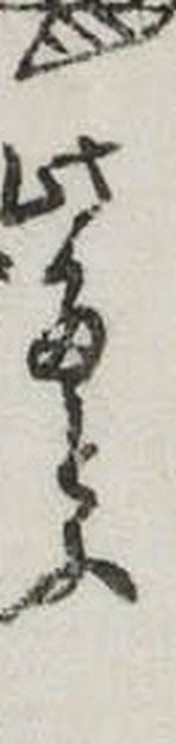此たとふ
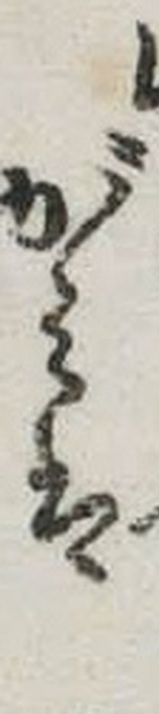がみは
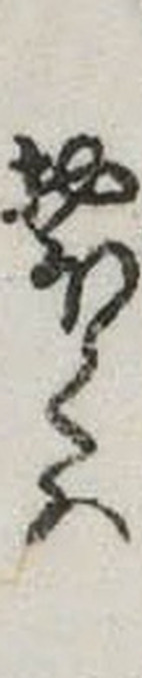おほくは
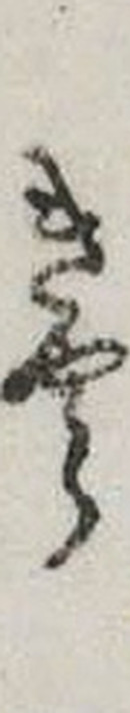きやう
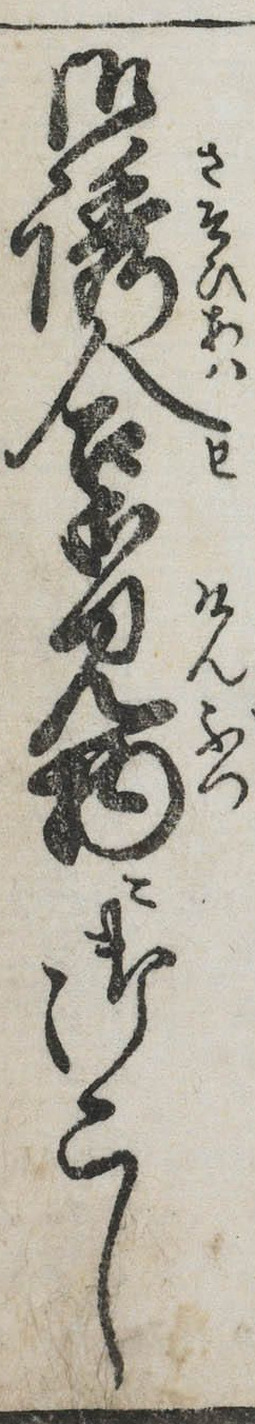御誘合見物に御こし

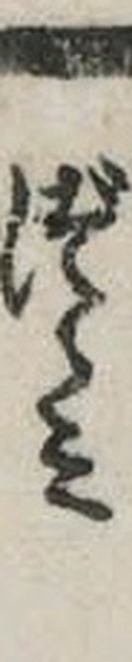づゝみ
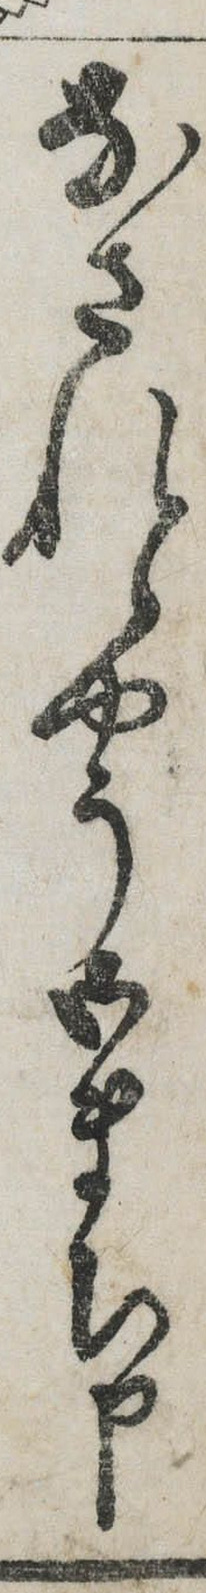なされ候やう御まち申
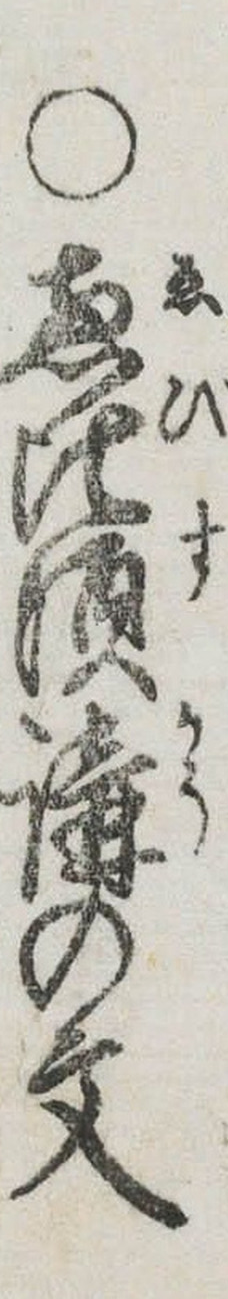○恵比須講の文
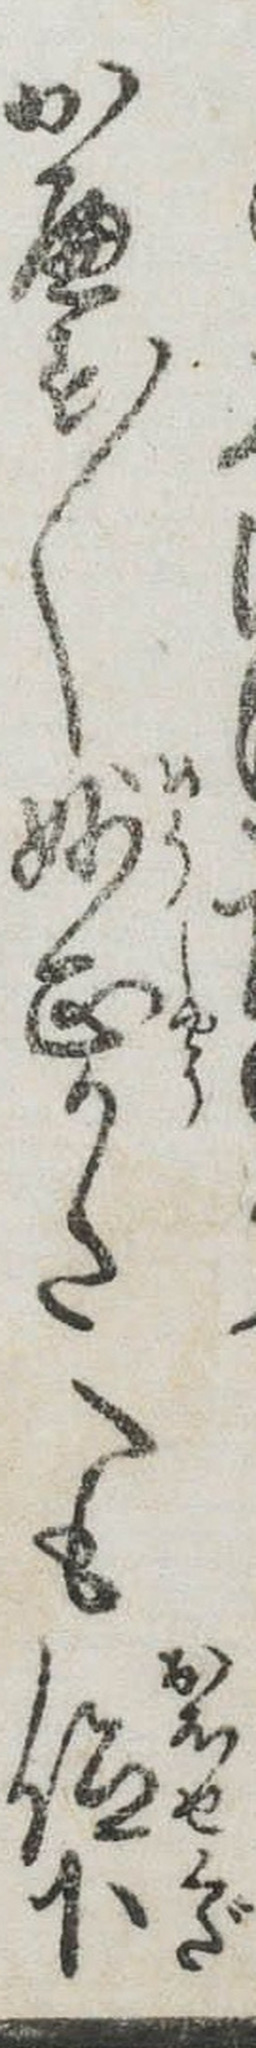かへす〳〵妙正かたへも仰下
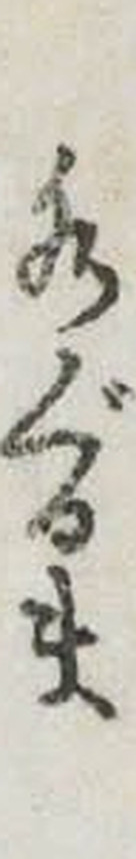水ぐるま
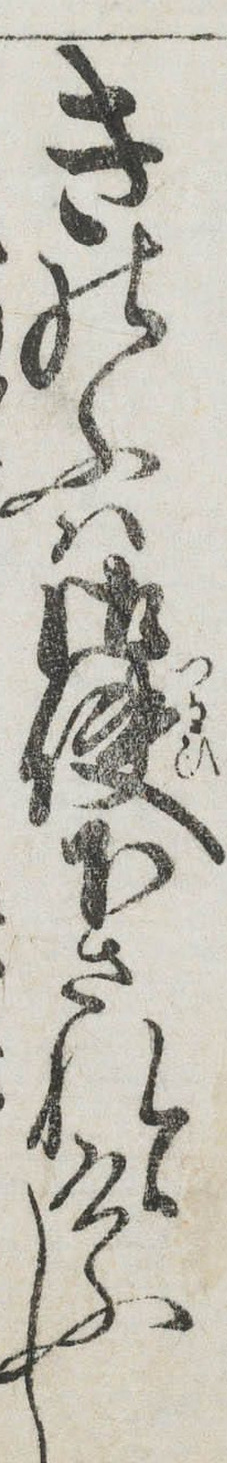きのふは御使下され候けふし
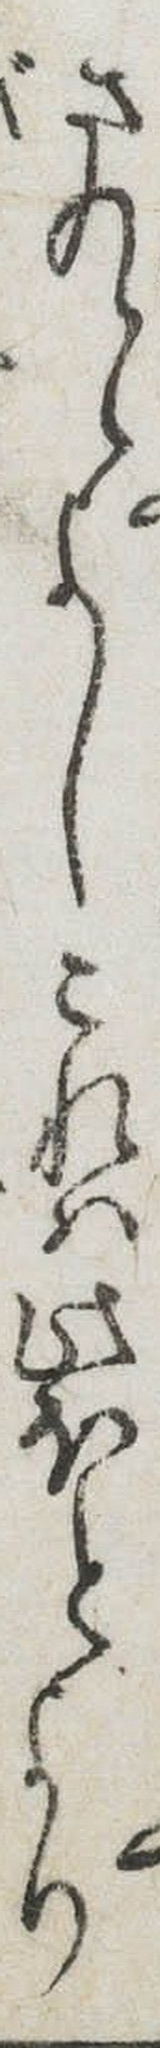され候よしこれは此ほとより
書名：頭書萬用婦人手紙之文言
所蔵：東京学芸大学教育コンテンツアーカイブ
